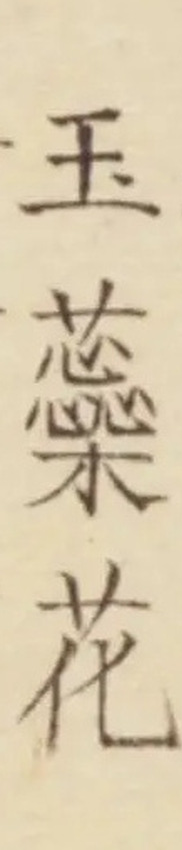玉蘂花
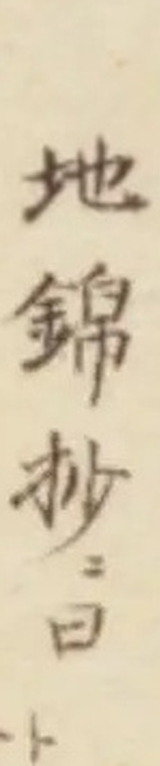地錦抄に曰
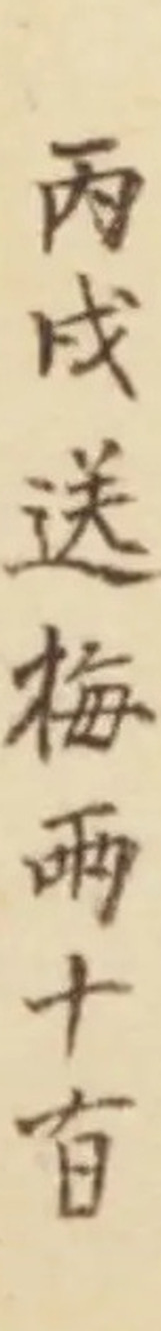丙戌送梅雨十有
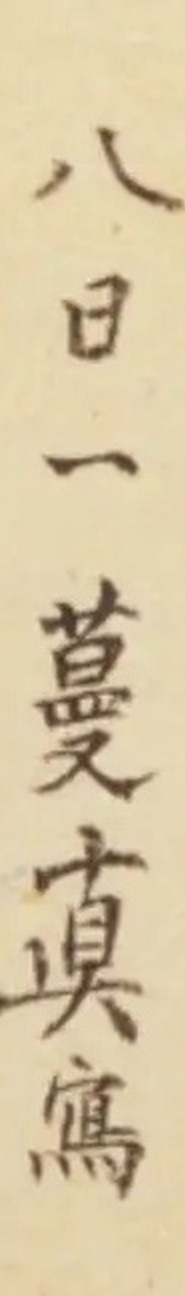八日蔓真寫
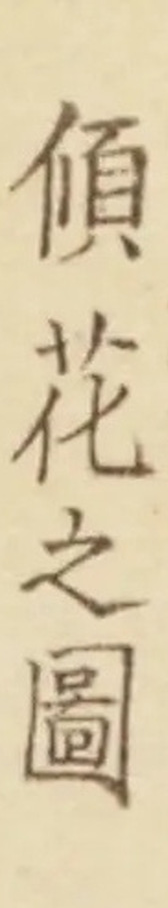傾花之圖

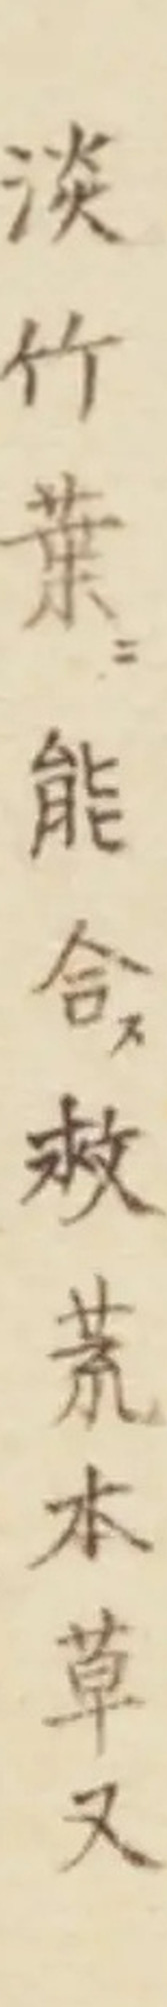淡竹葉に能合す救荒本草又
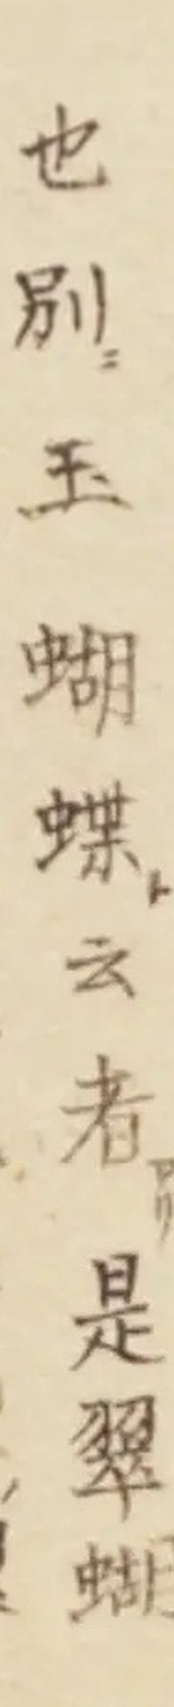也別に玉蝴蝶と云う者あり是翠蝴

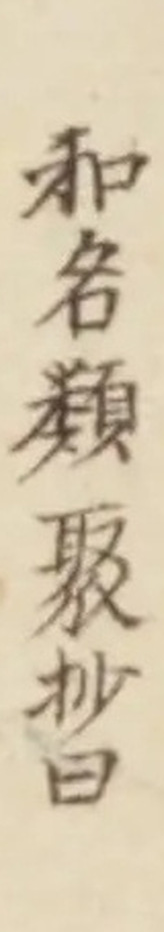和名類聚抄曰
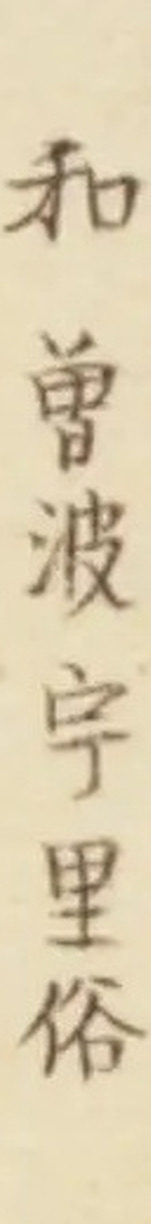和曽波宇里俗
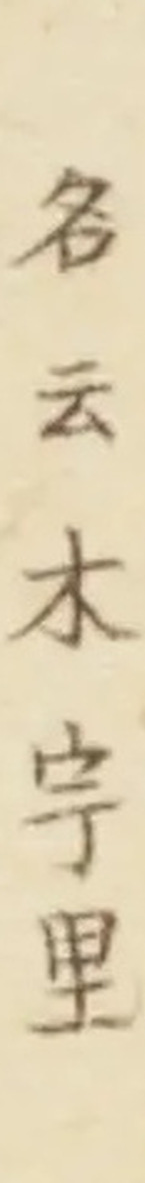名云木宇里
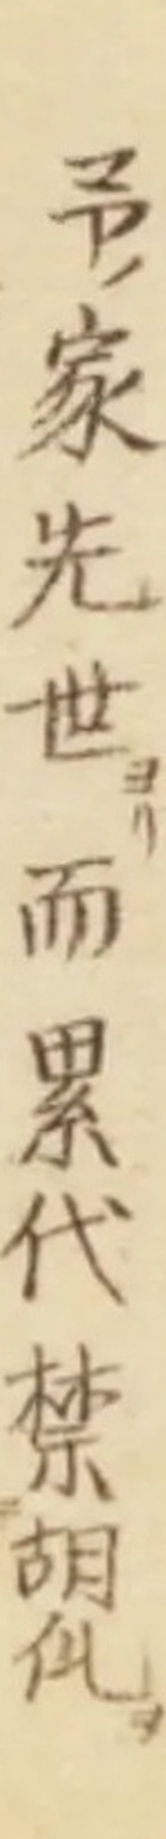予の家先世より而累代禁胡瓜を
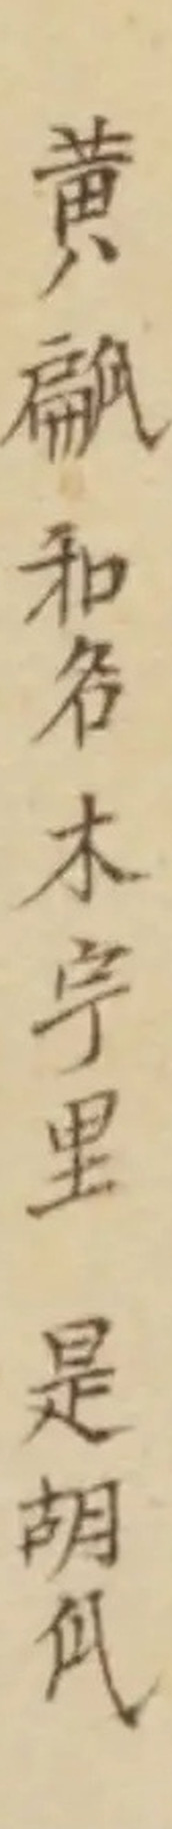黄和名木宇里是胡瓜
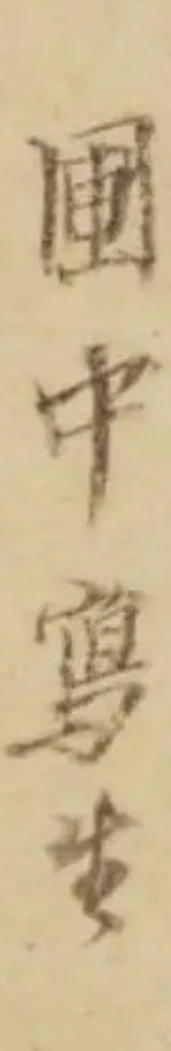圃中寫生

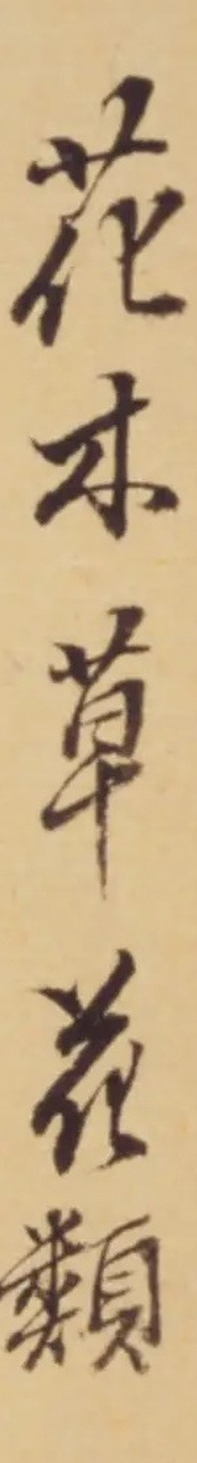花木草花類
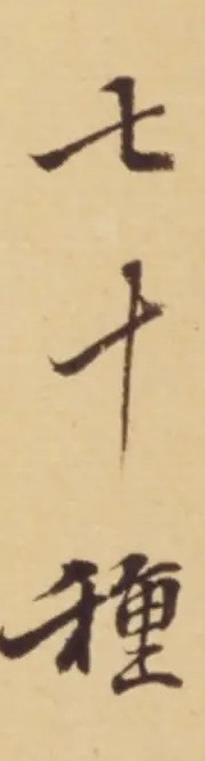七十種
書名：梅園草木花譜夏之部. 3
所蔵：国立国会図書館 National Diet Library, JAPAN
